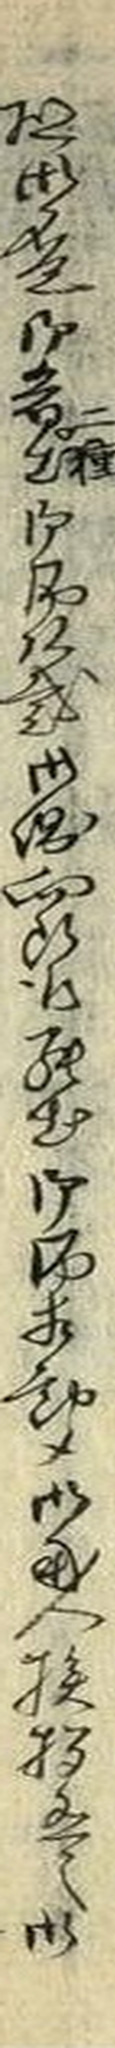組御盃御肴〇二種出御酒頂戴御側向頭取罷出御酒相勧メ御用人挨拶有之御
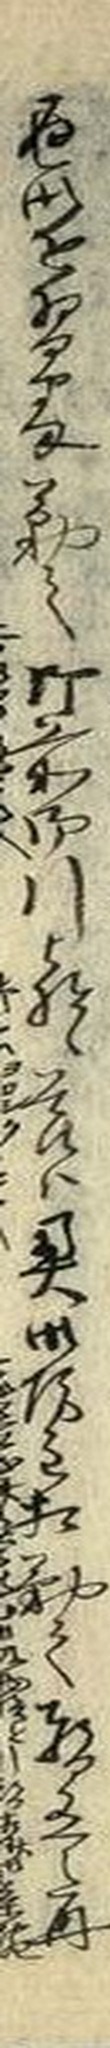通御近習番勤之御前御引被遊候節ハ奥御坊主相勤之暫有之再
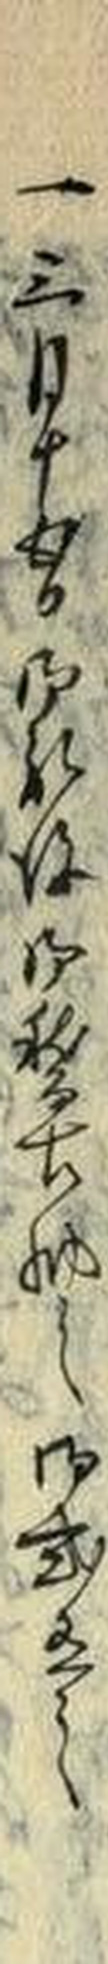一三月十五日御礼後御稽古納之御式有之
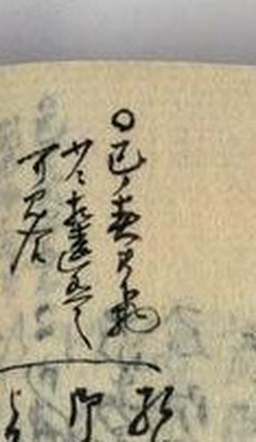〇己ノ春被下物
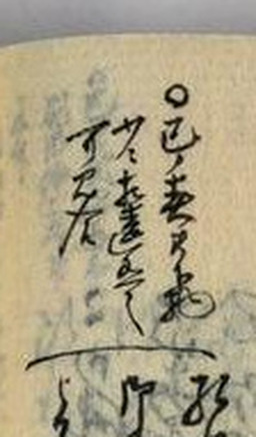少々相違有之
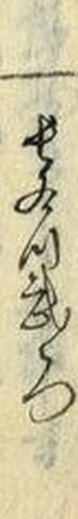長谷川武右衛門
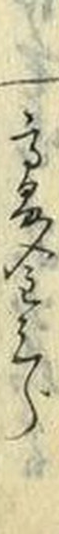高畠金三郎
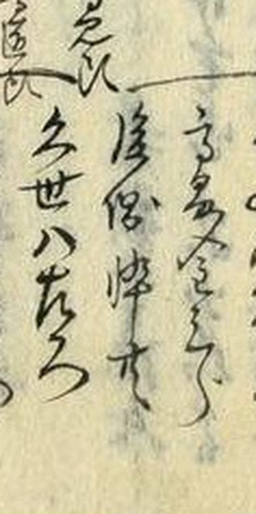後側忰共
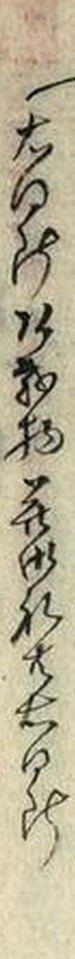右同断頂戴物幷御礼共右同断
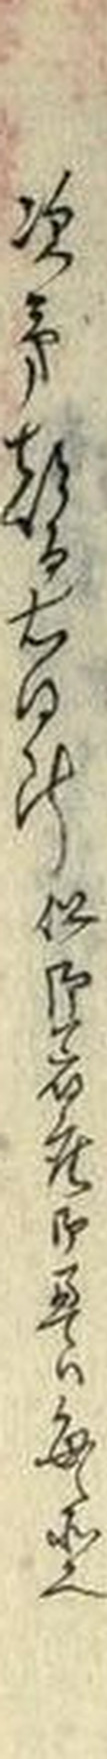次第都而右同断但御着座御畳ハ毎之所也御馬方
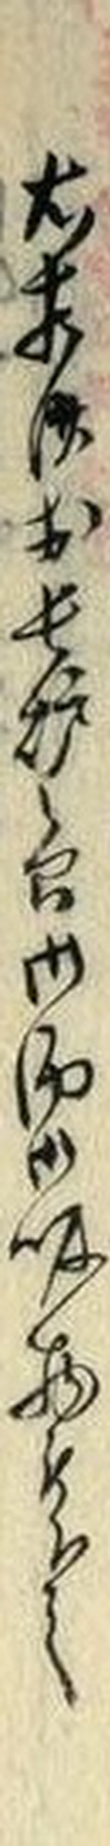右相済於長炉之間御酒御吸物被下之

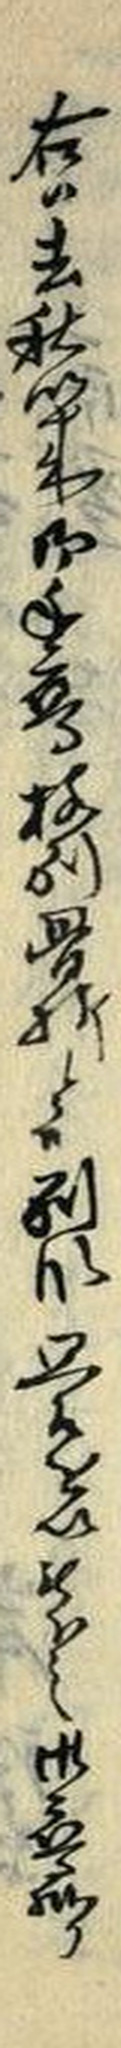右ハ去秋以来御手鷹格別骨折候ニ付別段思召を以被下之御鷹掛り
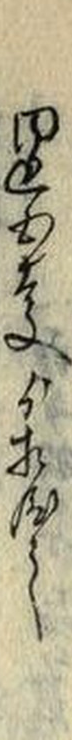田辺五太夫ゟ相渡之
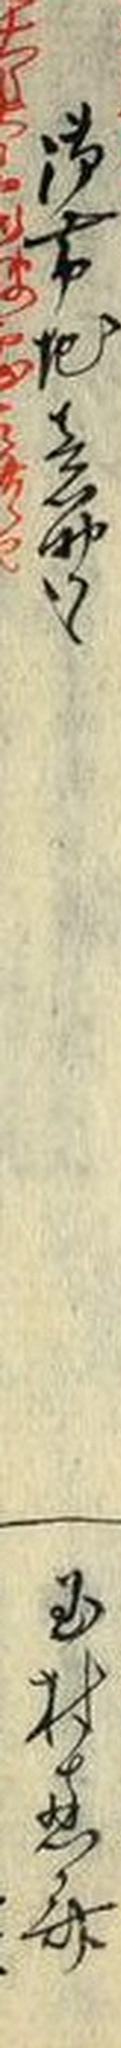御帯地壱筋ツヽ小嶋知策
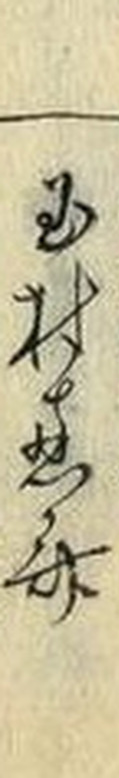玉村恵斎
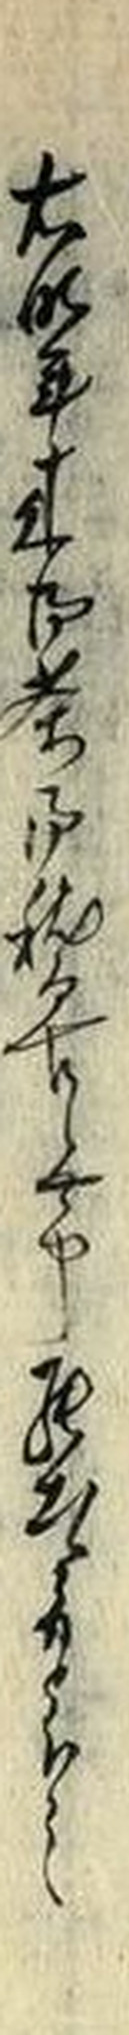右昨年来御茶御稽古之節罷出候ニ付被下之
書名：少傅日録抄（斉承付側向頭取日記、在国）
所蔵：福井県文書館 Fukui Prefectural Archives
